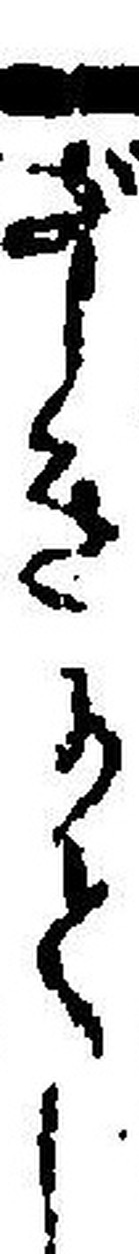ざしきにて
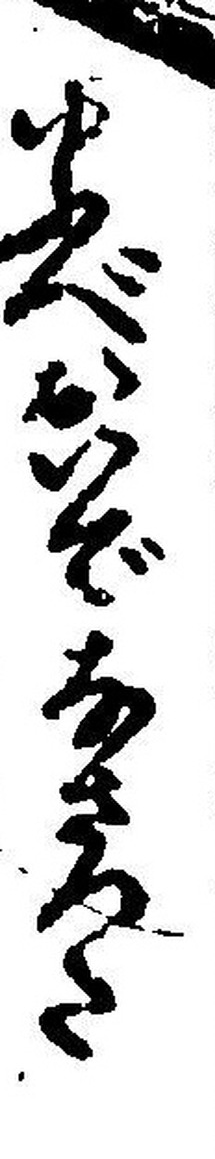ゆふべおいでなさつた
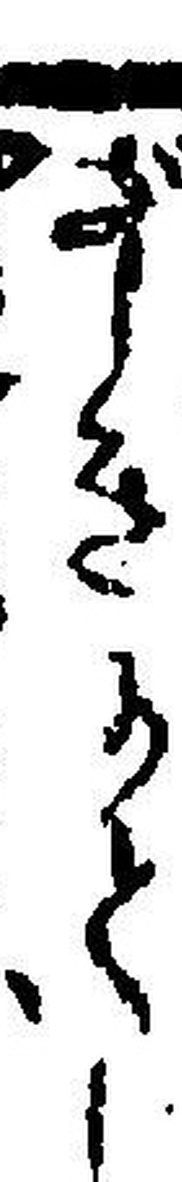ざしきにて
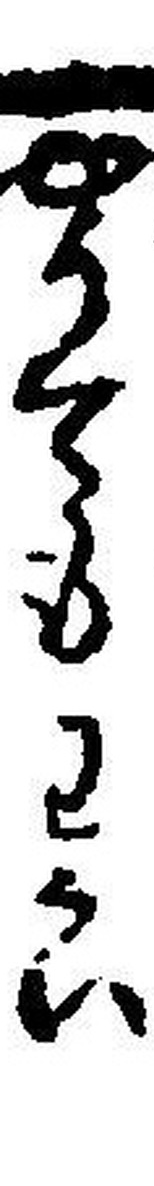やりてもわかい
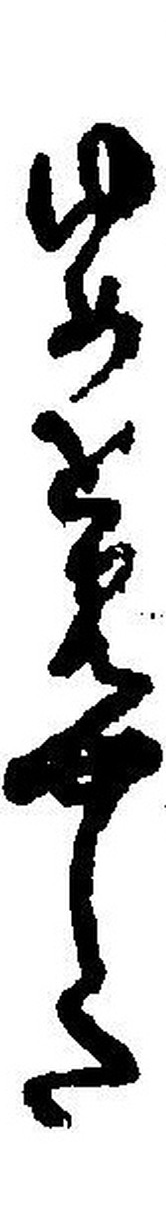ゆめを見やした
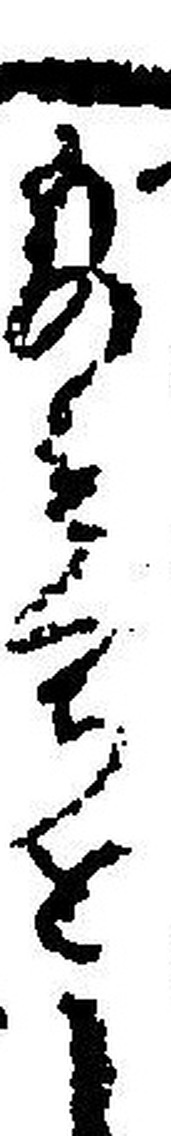ものもくちを
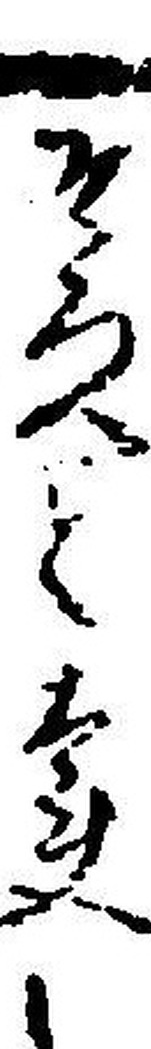そろへて太夫
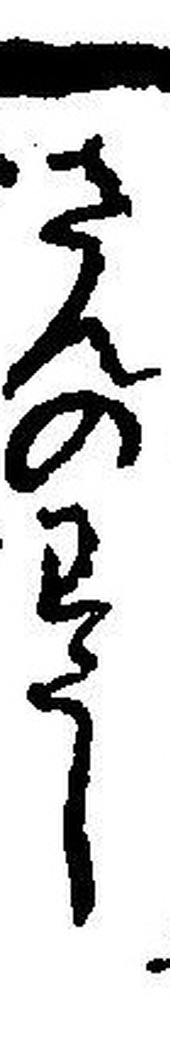さんのわたし
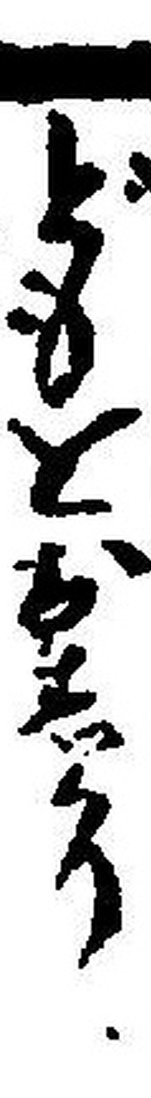どもをおしかり
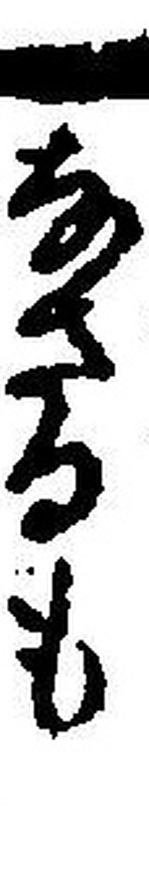なさるも
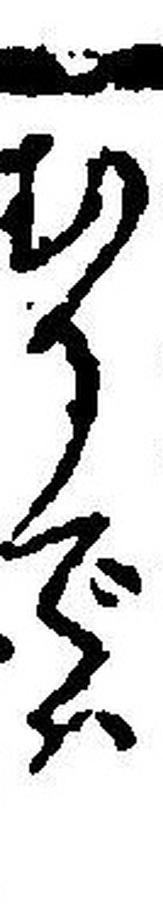むりでは
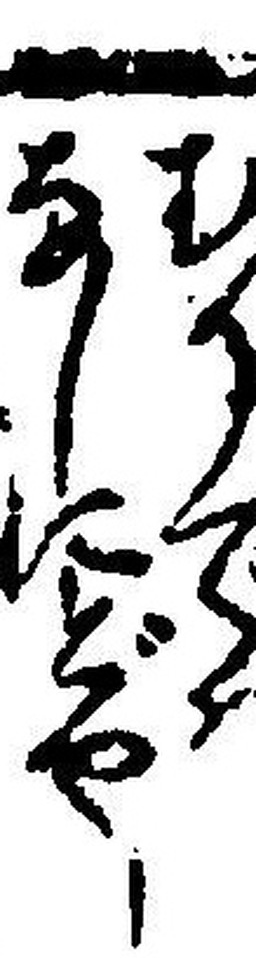なしにどや
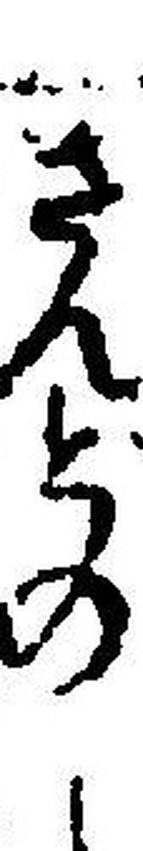さんどの
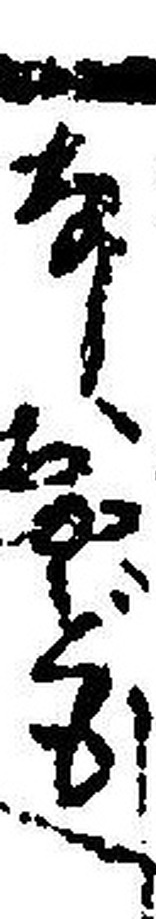なしおやども
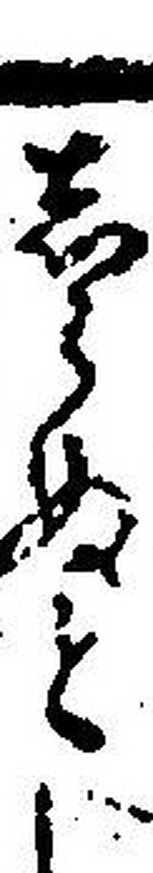しらぬと
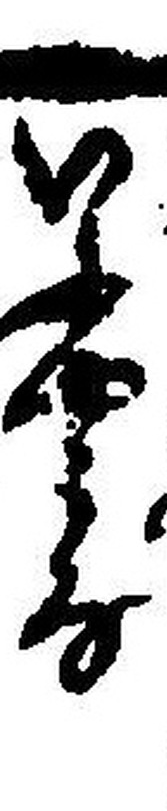いふやうな
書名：間違狐之女郎買 / 市場通笑作
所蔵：東京大学総合図書館 General Library in the University of Tokyo, JAPAN
